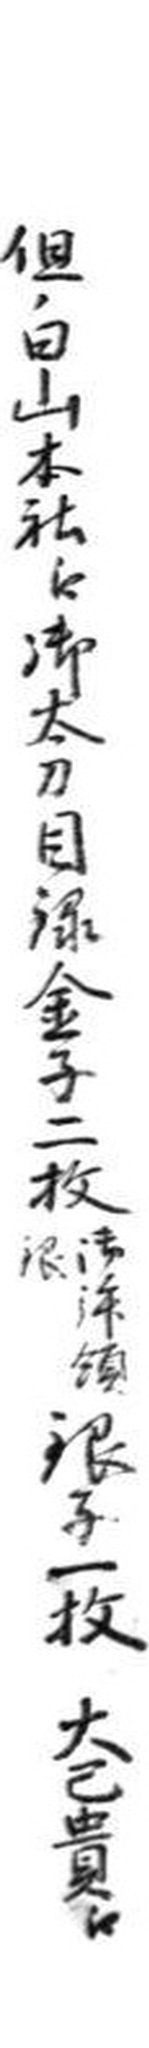但白山本社江御太刀目録金子二枚御拝領銀銀子一枚大己貴江
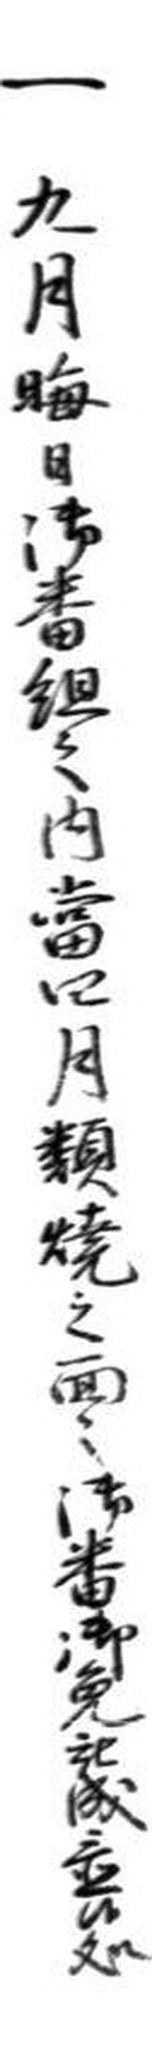一九月晦日御番組之内当四月類焼之面々御番御免被成置候処
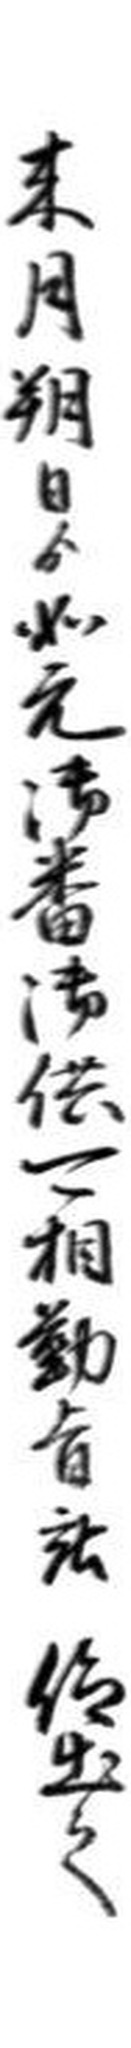来月朔日ゟ如元御番御供可相勤旨被仰出之
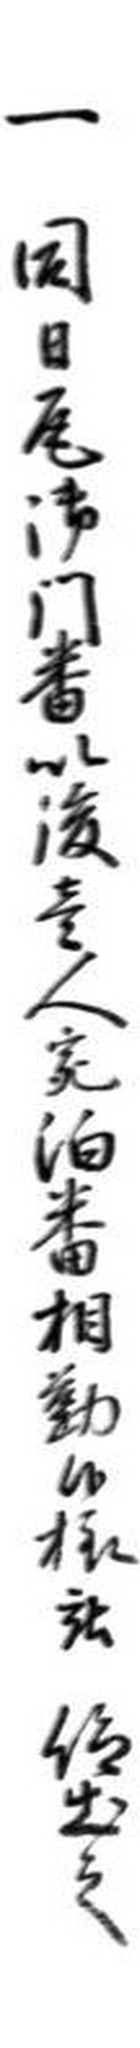一同日瓦御門番以後壱人宛泊番相勤候様被仰出之
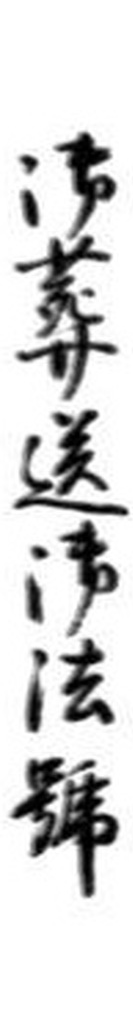御葬送御法号
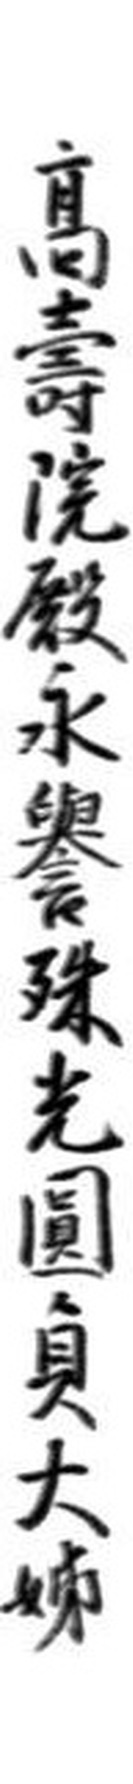高寿院殿永誉殊光円貞大姉
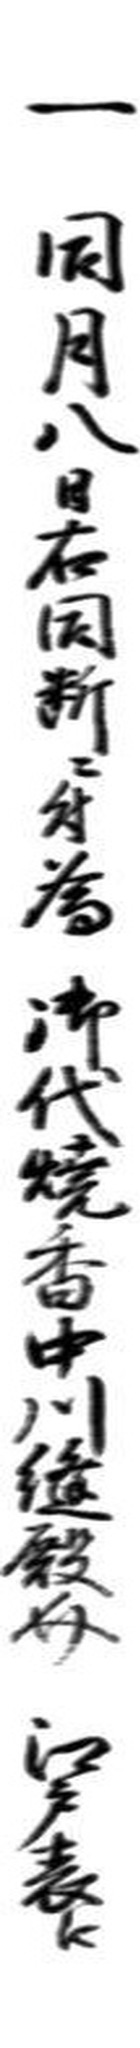一同月八日右同断ニ付為御代焼香中川縫殿介江戸表江
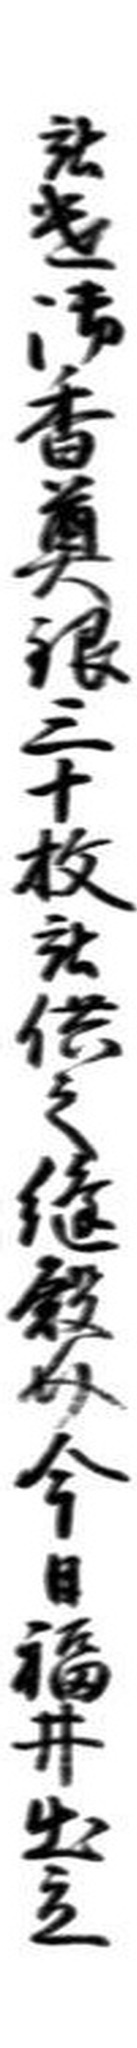被遣御香奠銀三十枚被供之縫殿介今日福井出立
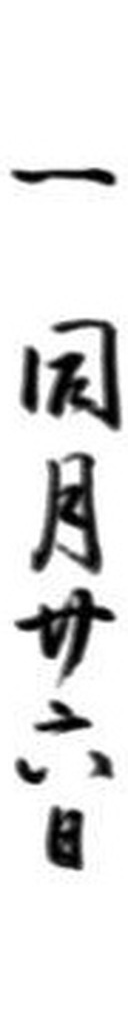一同月廿六日
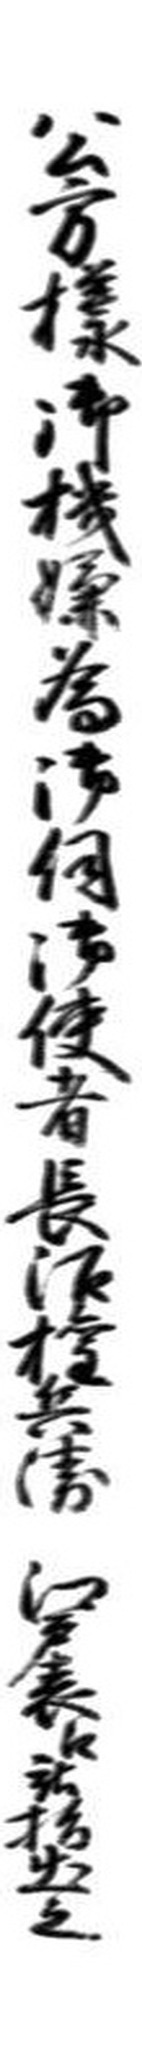公方様御機嫌為御伺御使者長沼権兵衛江戸表江被指出之
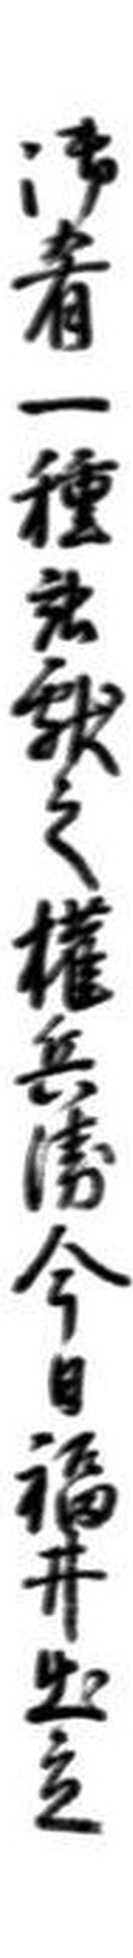御肴一種被献之権兵衛今日福井出立
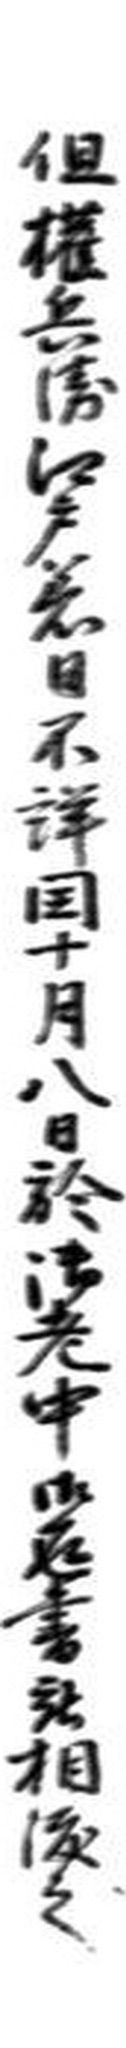但権兵衛江戸着日不詳閏十月八日於御老中御返書被相渡之

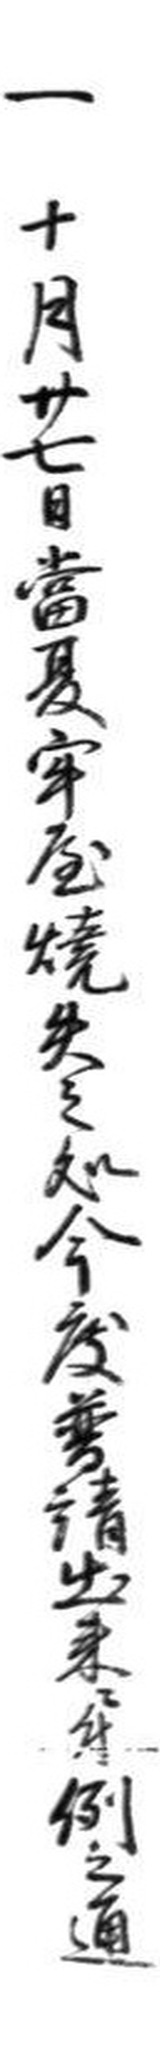一十月廿七日当夏牢屋焼失之処今度普請出来ニ付例之通
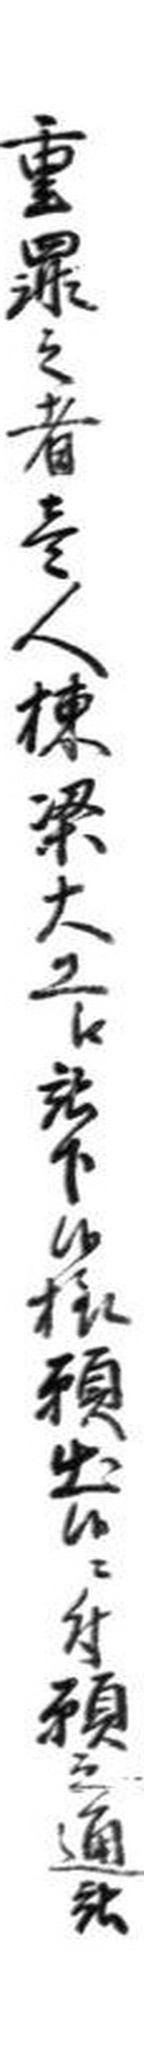重罪之者壱人棟梁大工江被下候様願出候ニ付願之通被
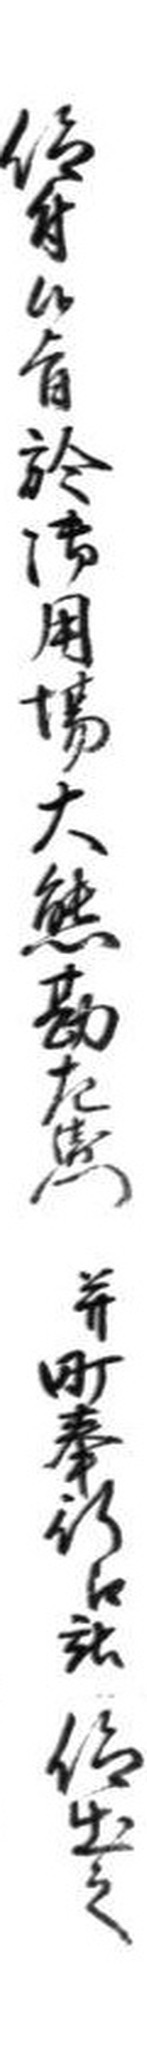仰付候旨於御用場大熊勘左衛門并町奉行江被仰出之
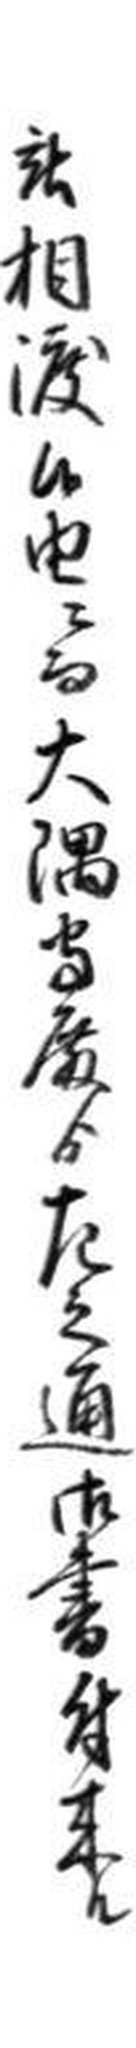被相渡候由ニ而大隅守ゟ左之通御書付来ル
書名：家譜 七 光通公 従寛文四年到同九年
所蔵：福井県文書館 Fukui Prefectural Archives
